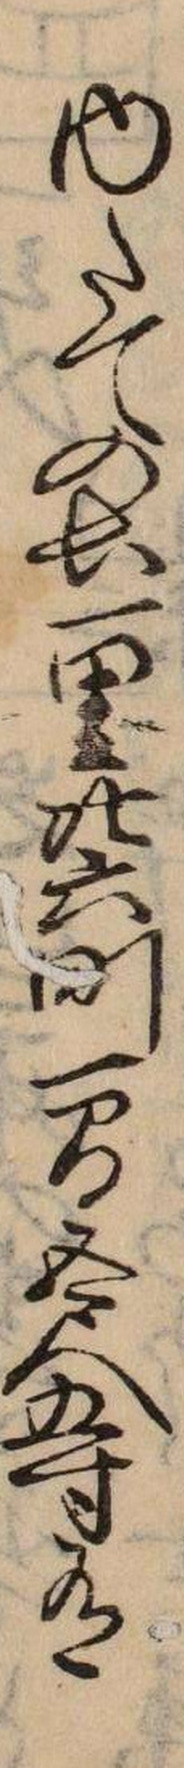内たての長一里廿六町一間五尺五寸有
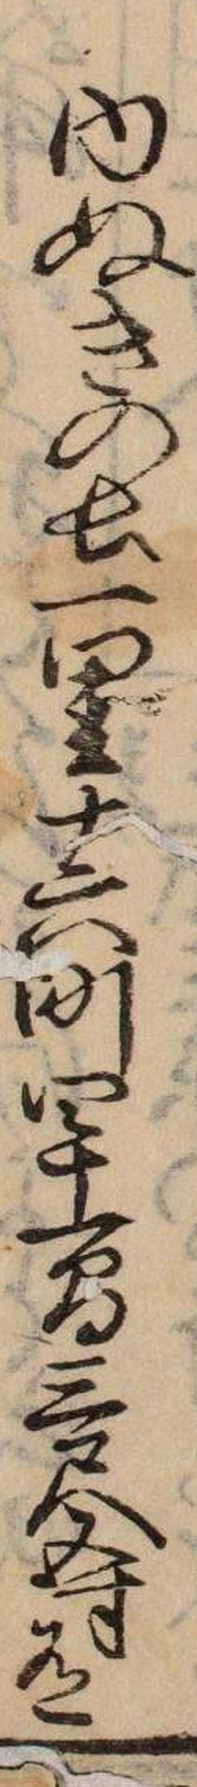内ぬきの長一里十六町四十一間三尺五寸有
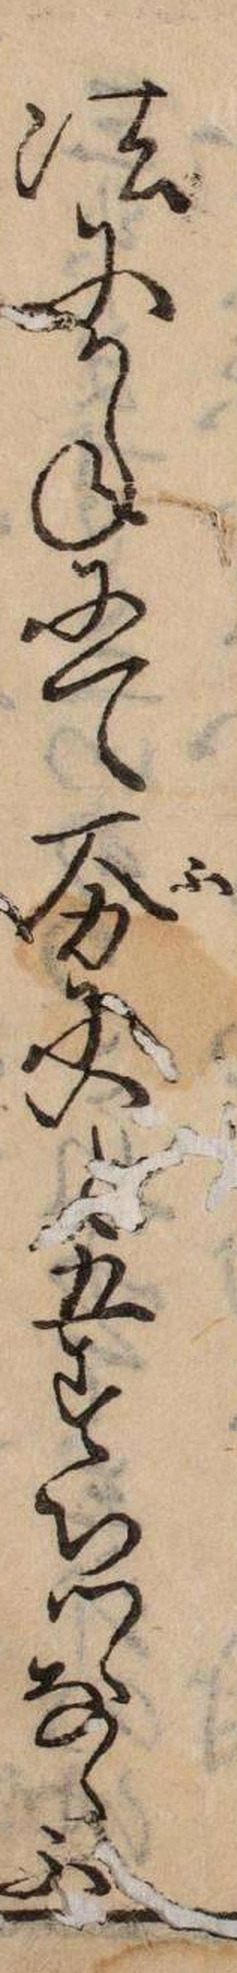法にかねにて一分にいと五すちつつなくふ
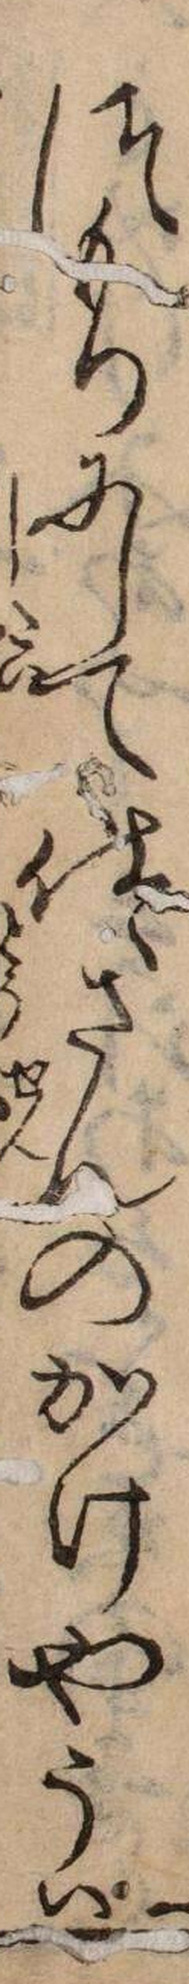つもりにしてさんのかけやうは

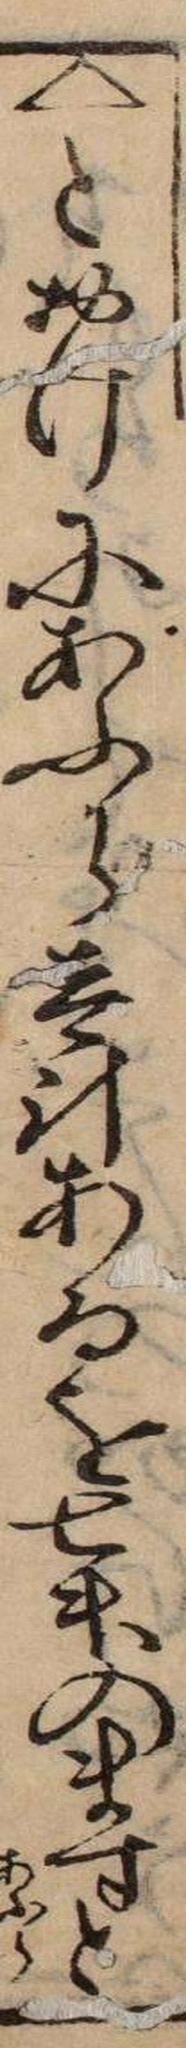△とおけにあふら壱斗あるを七升のますと
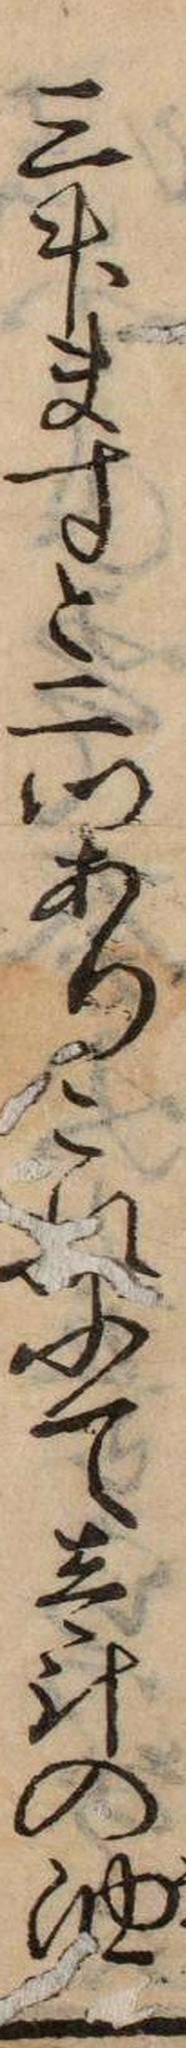三升ますと二つありこれにて壱斗の油
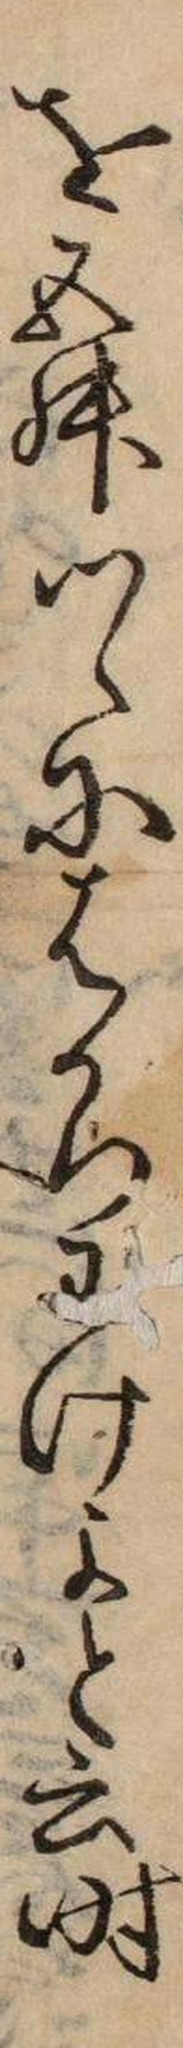を五升つつにはかりわけよと云時
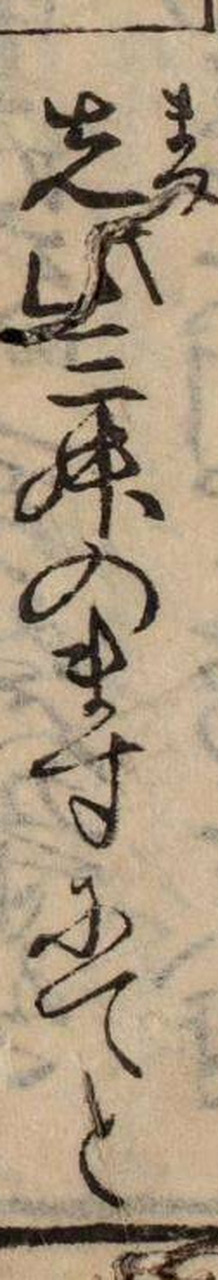先此二升のますにてと
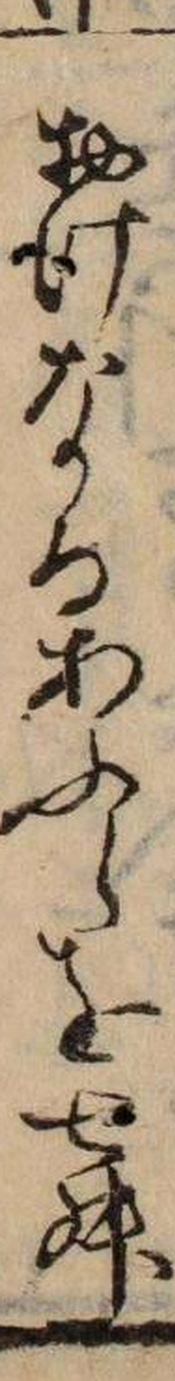おけなるあふらを七升
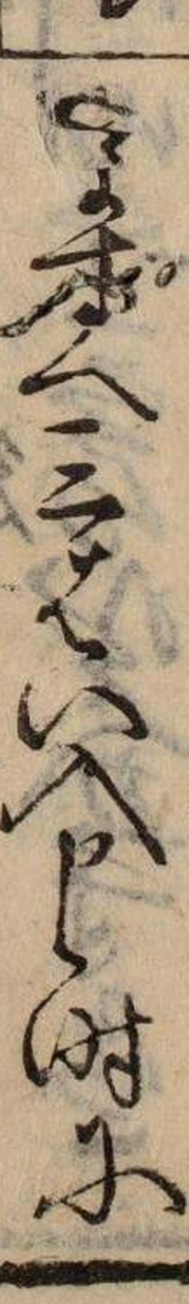よすへ三はい入申候時に
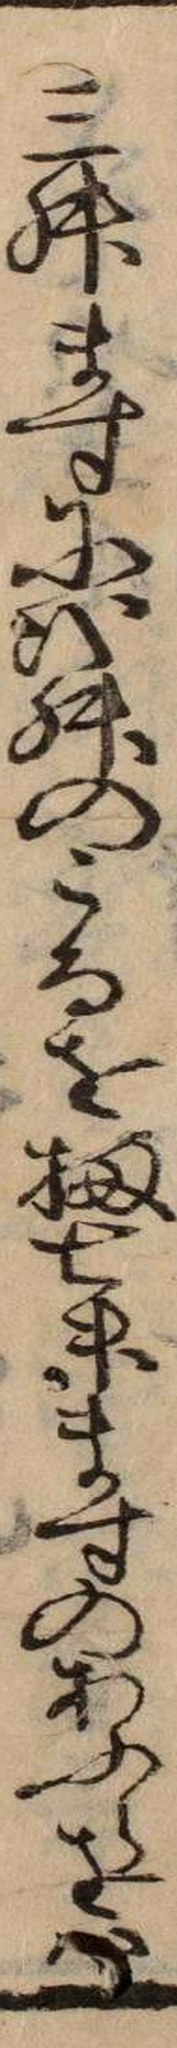三升ますに弐升のこるを扨七升ますのあふらをは
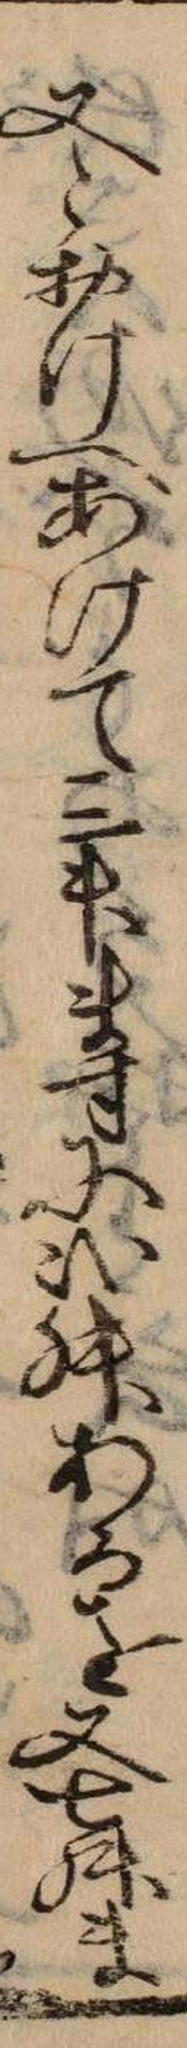又とおけへあけて三升ますに弐升あるを又七升ま
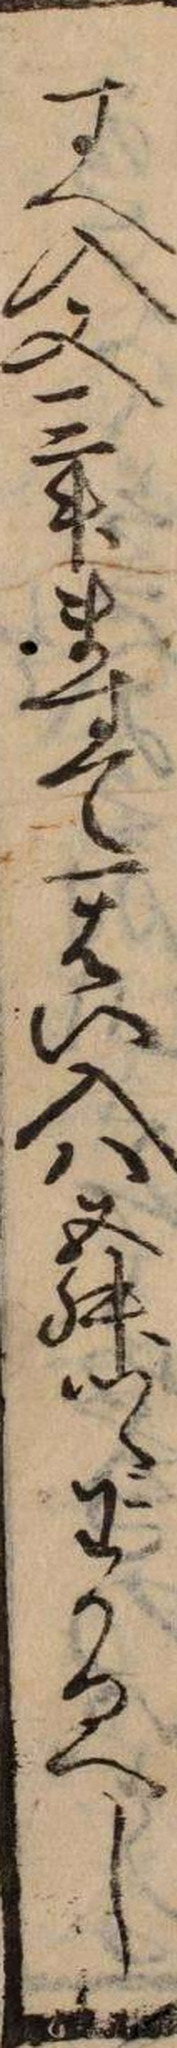すへ入又三升ますて一はい入は五升つつわかるへし
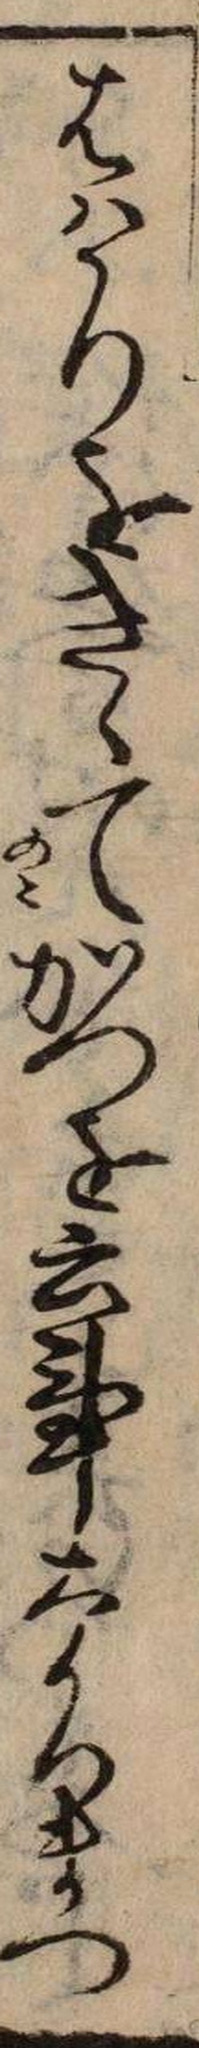ははかりをきゝてかつを云事なかりまつ
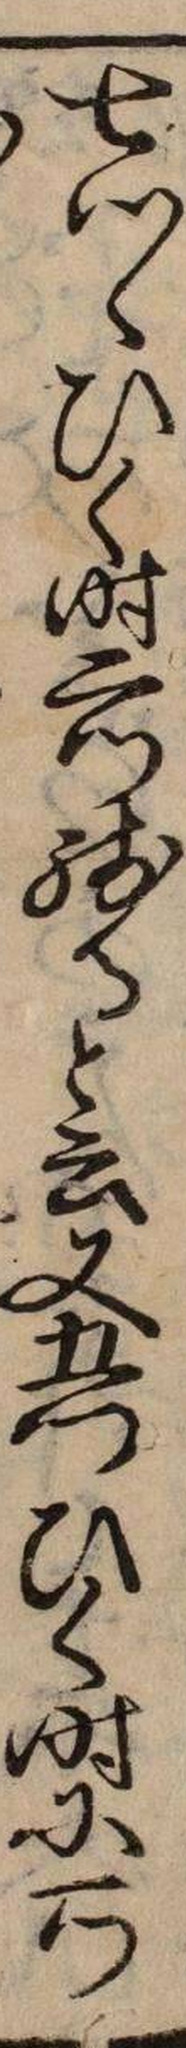七つつひく時二つ残ると云又五つひく時に一つ
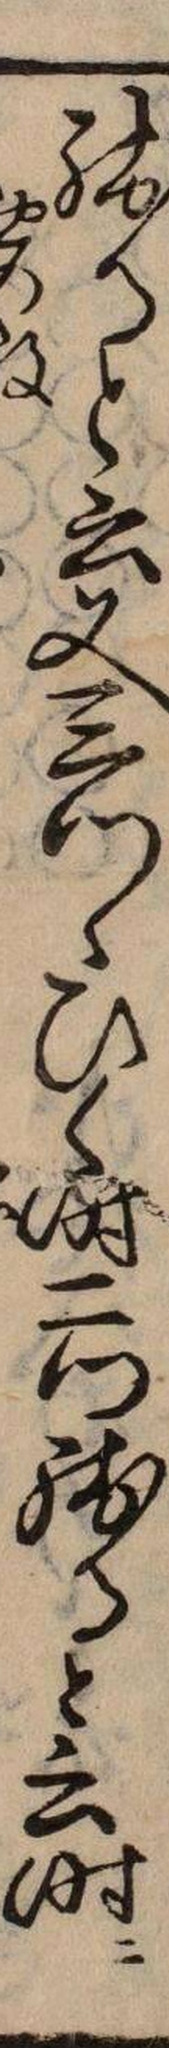残ると云又三つつひく時二つ残ると云時に
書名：塵劫記（寛永11年自跋、京都府立京都学・歴彩館追貴8）
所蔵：京都府立京都学・歴彩館 国文学研究資料館
